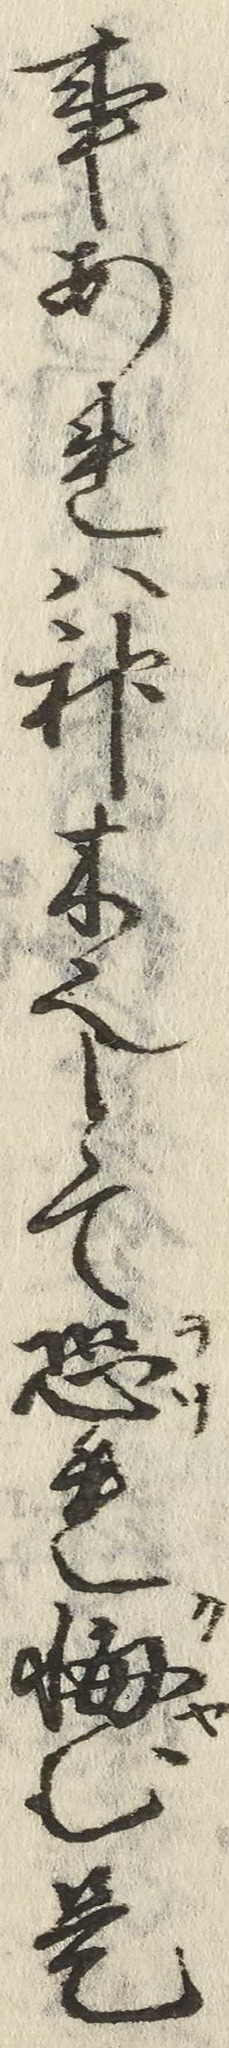事あれは神木也とて恐れ悔む是
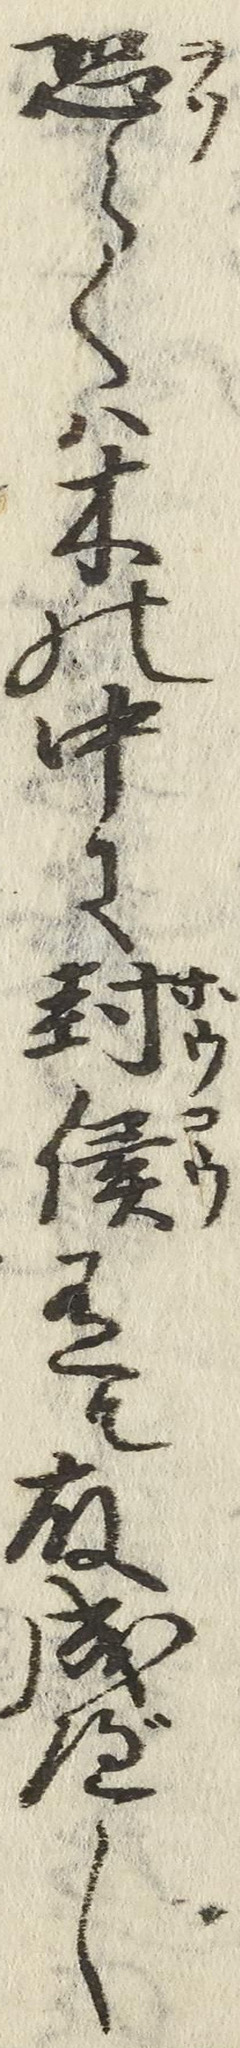恐らくは木の中に封侯有ル故成べし
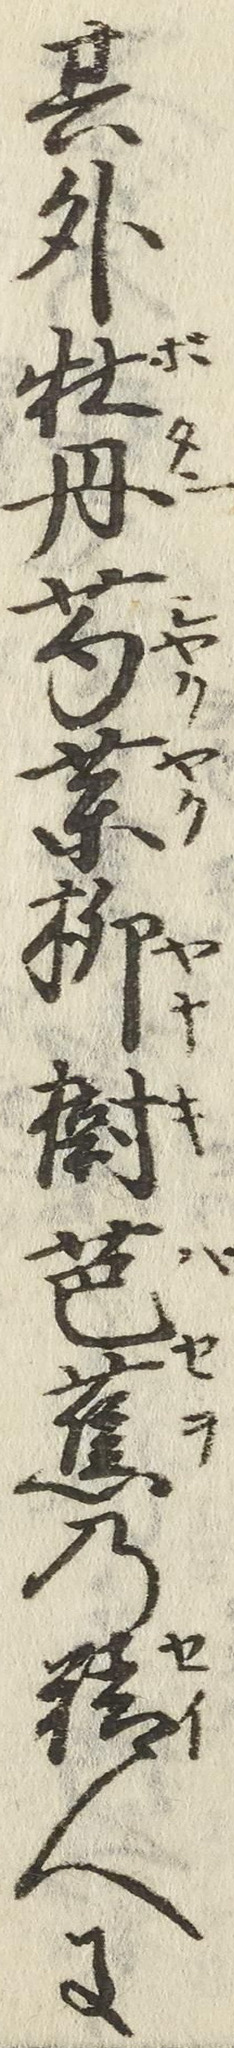其外牡丹芍薬柳樹芭蕉の精人に
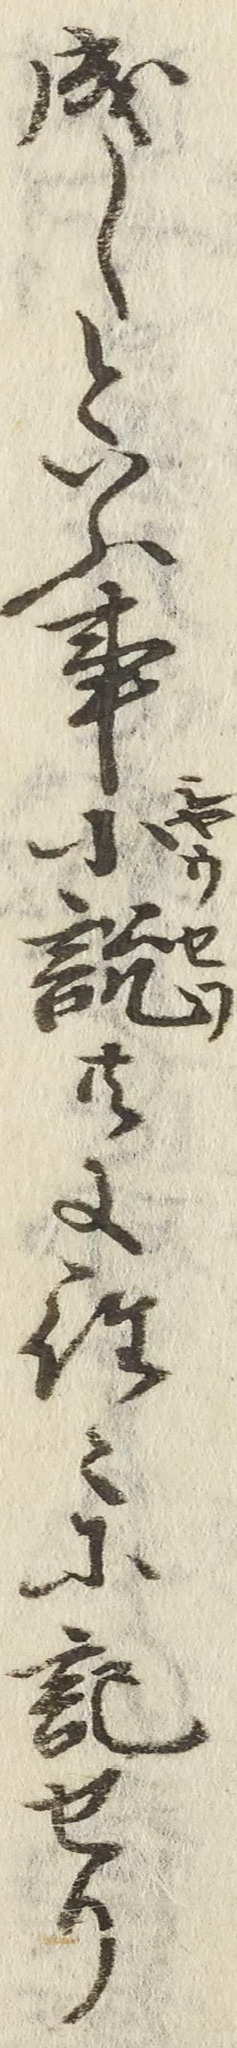成しといふ事小説共に往〻に記せり
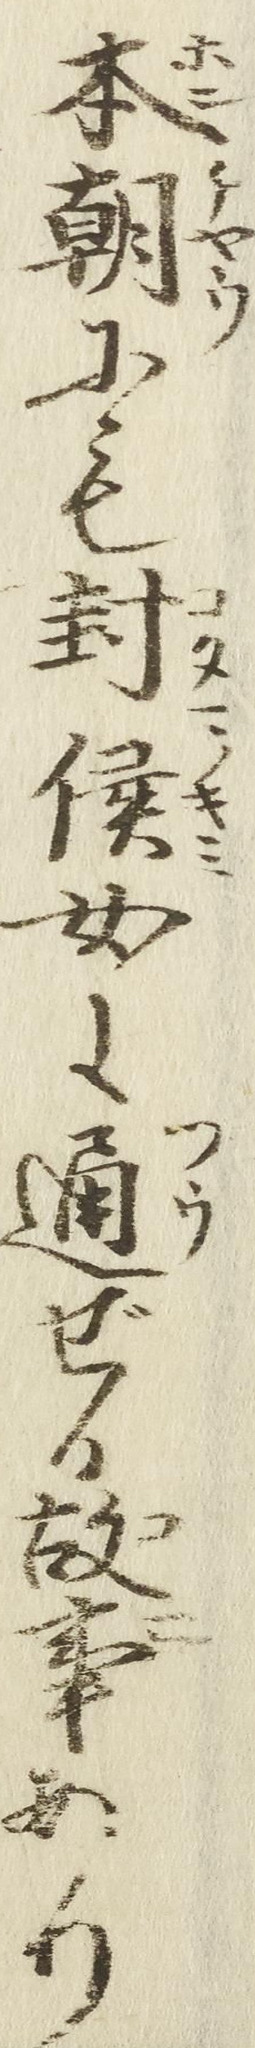本朝にも封侯女に通ぜる故事あり
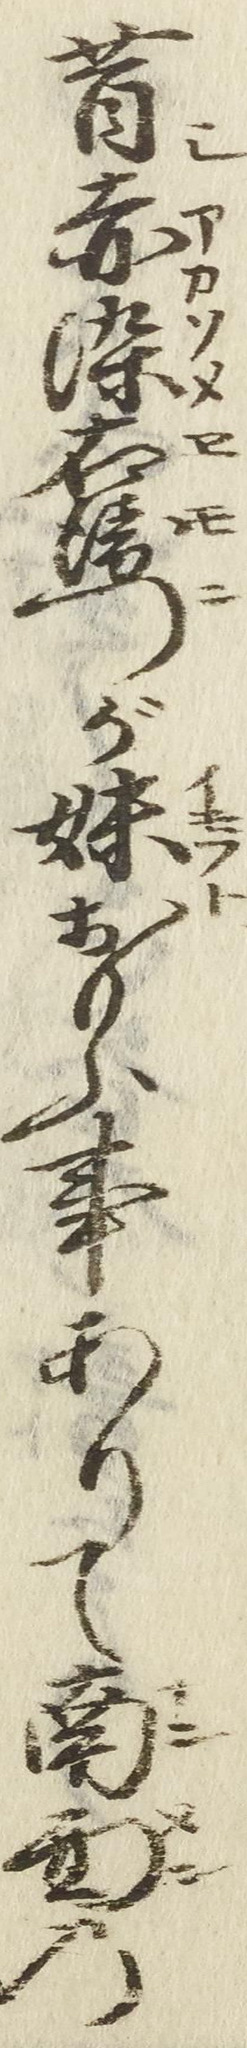昔シ赤染衛門が妹おりふ事ありて南面の
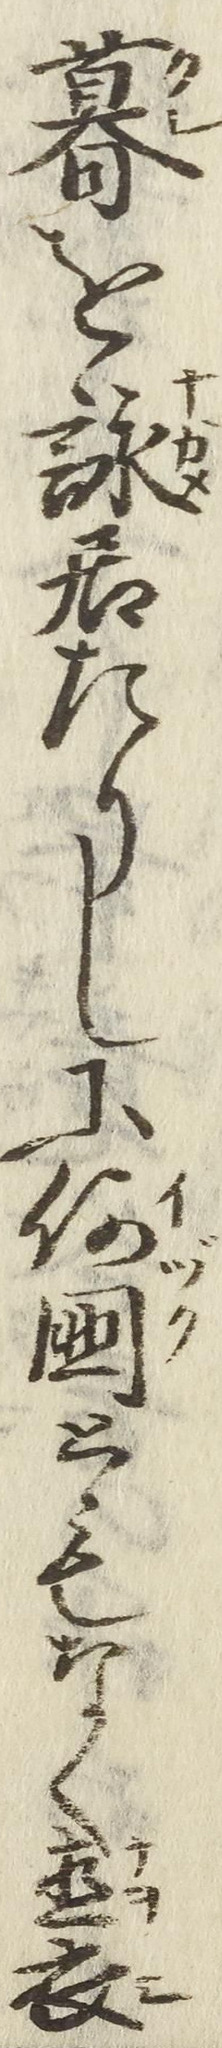暮を詠居たりしに何国ともなく直衣
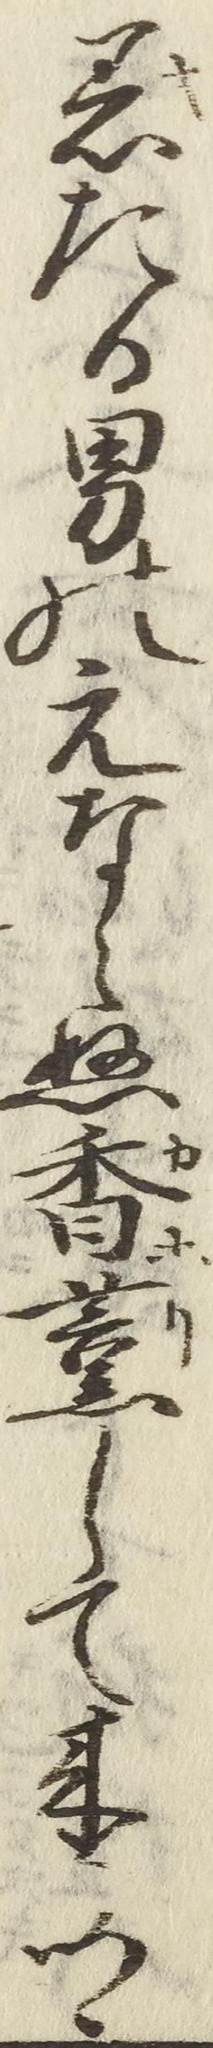着たる男のえならぬ香薫して来ツヽ
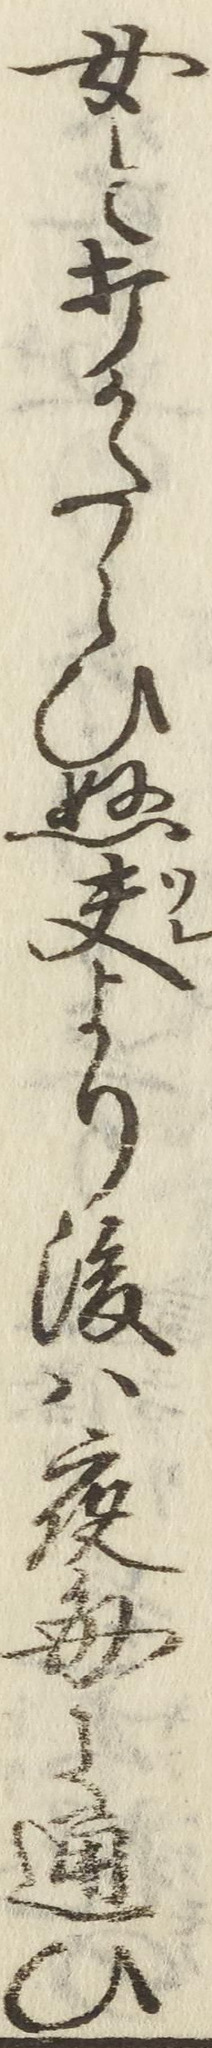女と打かたらひぬ夫より後は夜毎に通ひ
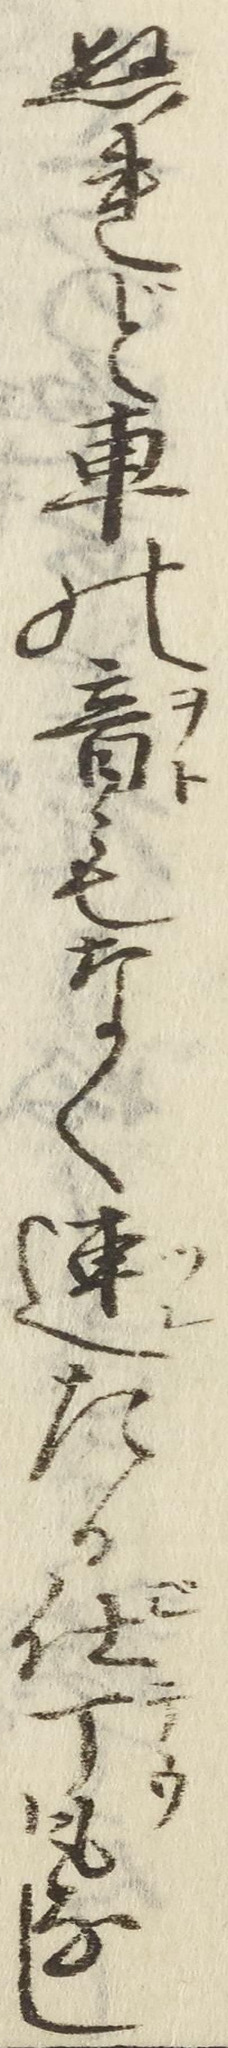ぬれど車の音もなく連たる仕丁もなし
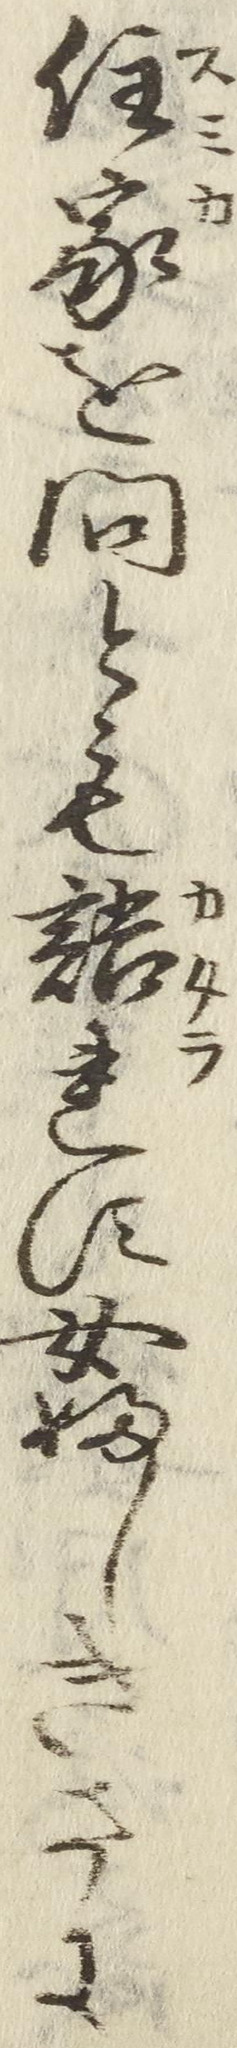住家を問とも語れす女ふしきさに
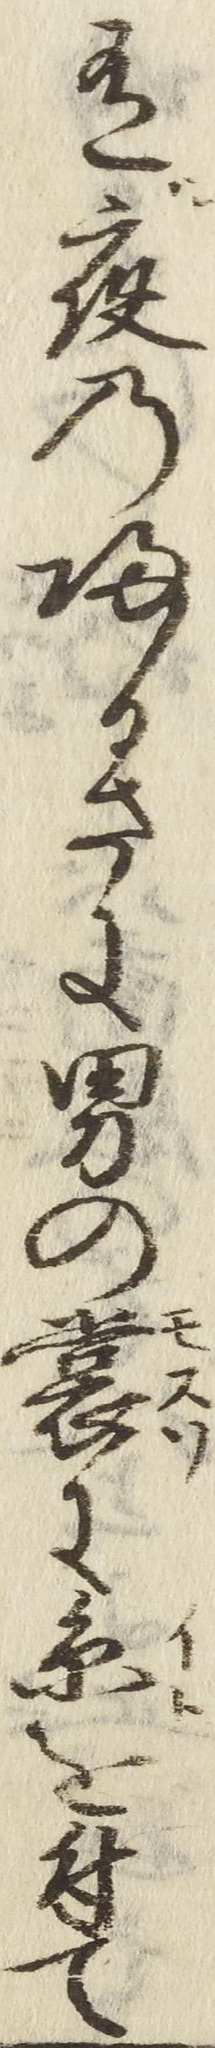有ル夜の帰るさに男の裳に糸を付て

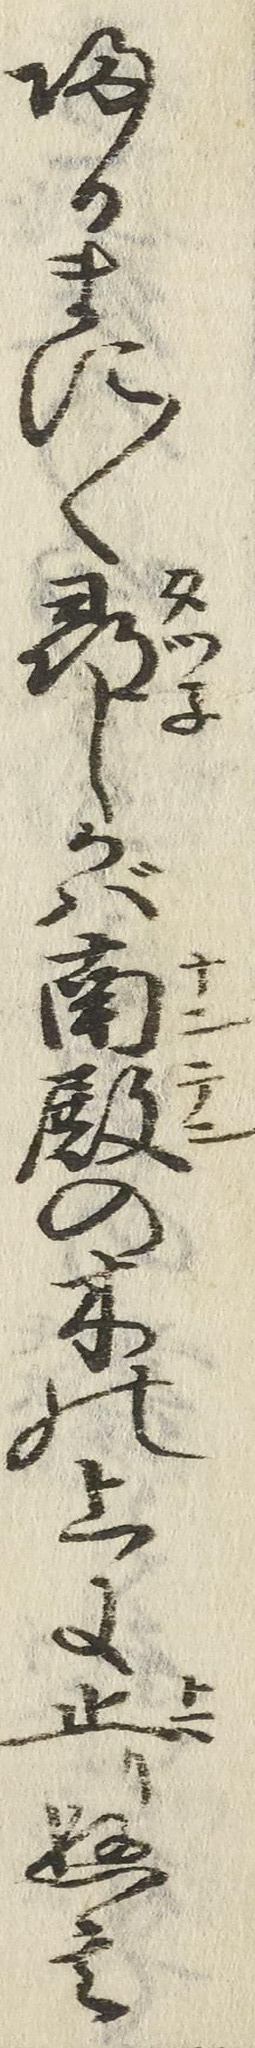帰るまに〳〵尋しかば南殿の木の上に止りぬ其
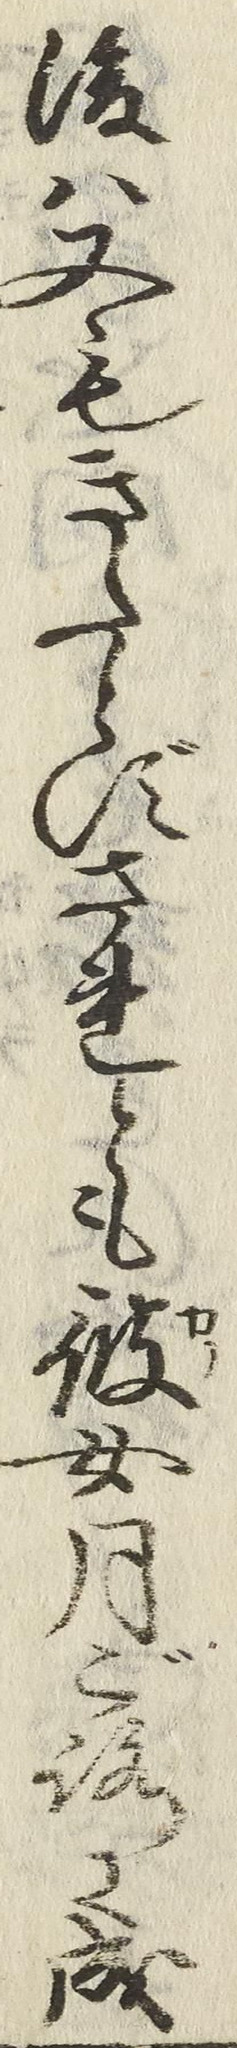後は又もきたらずされとも彼女月ごろに成
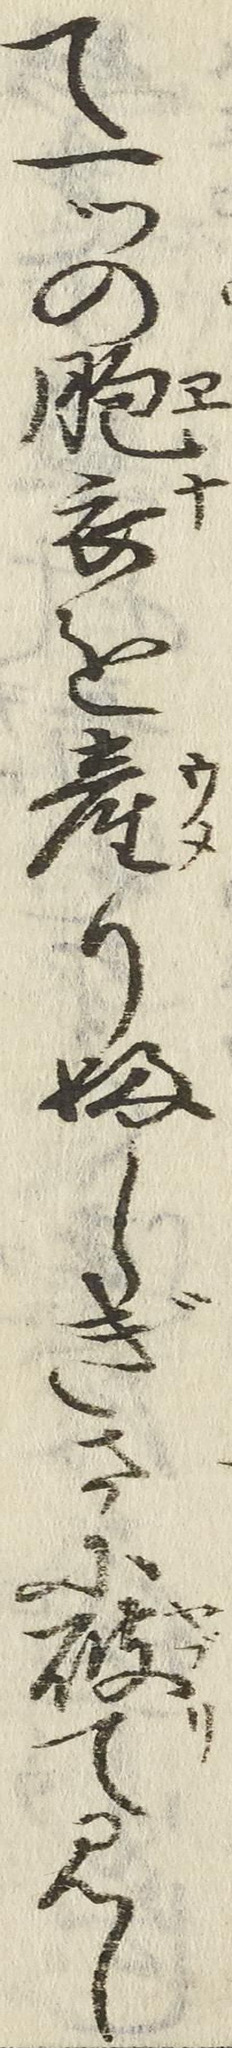て一ツの胞衣を産りふしぎさに破て見し
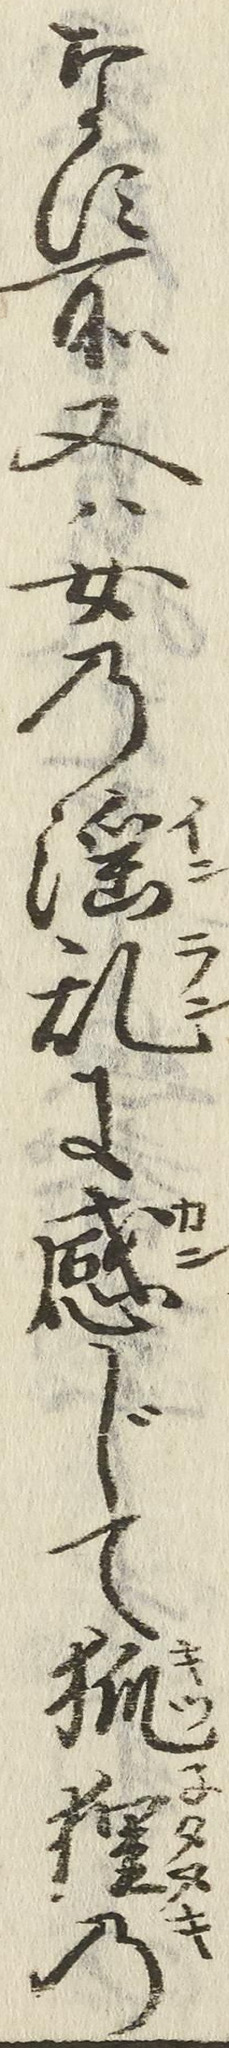なす所又は女の淫乱に感じて狐狸の
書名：天地或問珍　天
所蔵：東京大学地震研究所図書室 Earthquake Research Institute Library, The University of Tokyo, JAPAN
